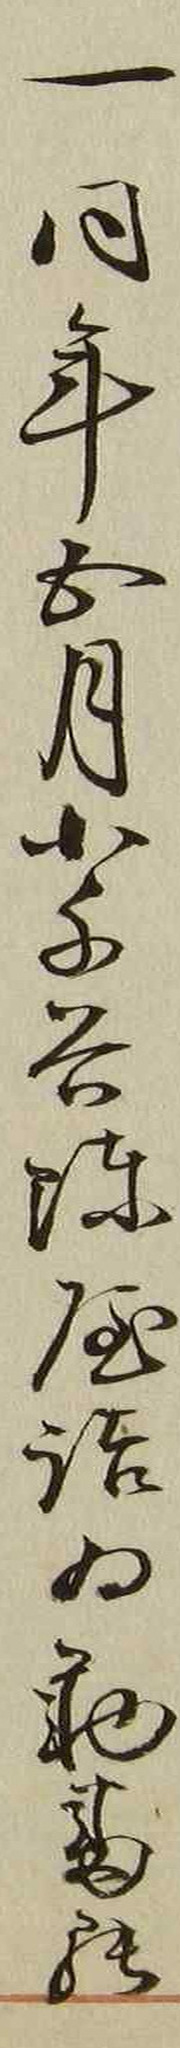一同年五月小千谷陣屋詰為勤番罷
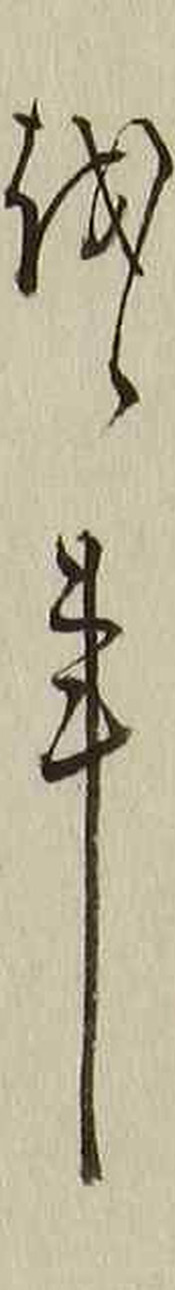越候事
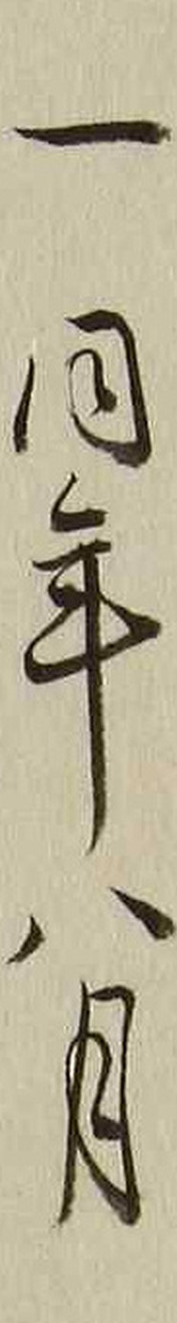一同年八月
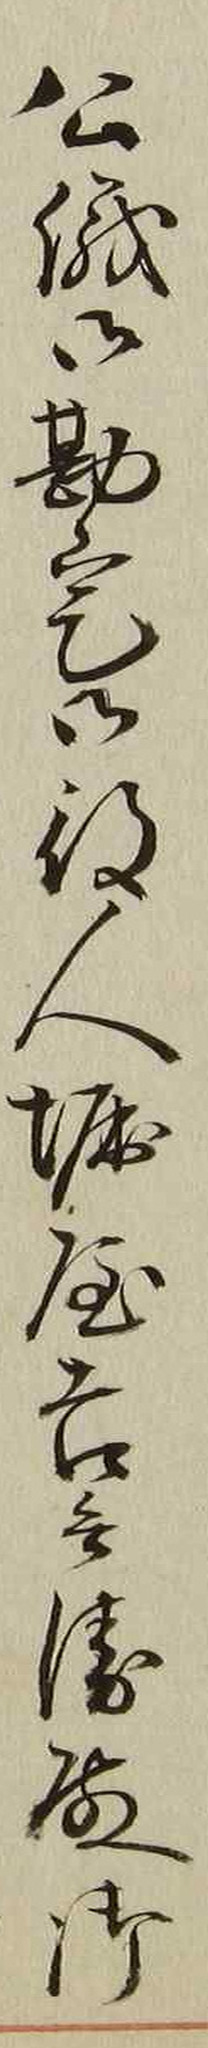公儀御勘定御役人堀屋吉兵衛殿御
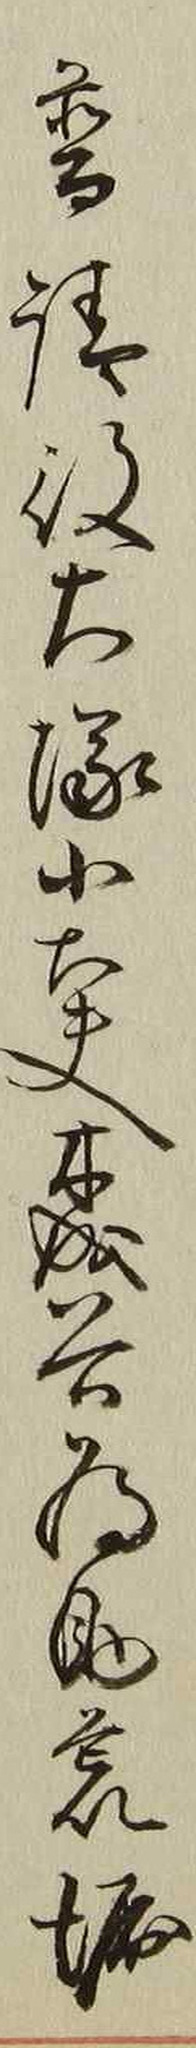普請役大塚小大夫森谷為助荒堀
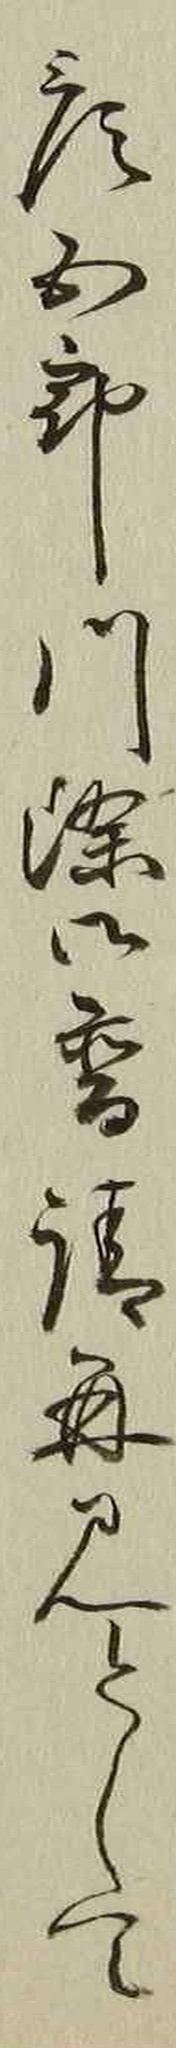彦五郎川際御普請再見として
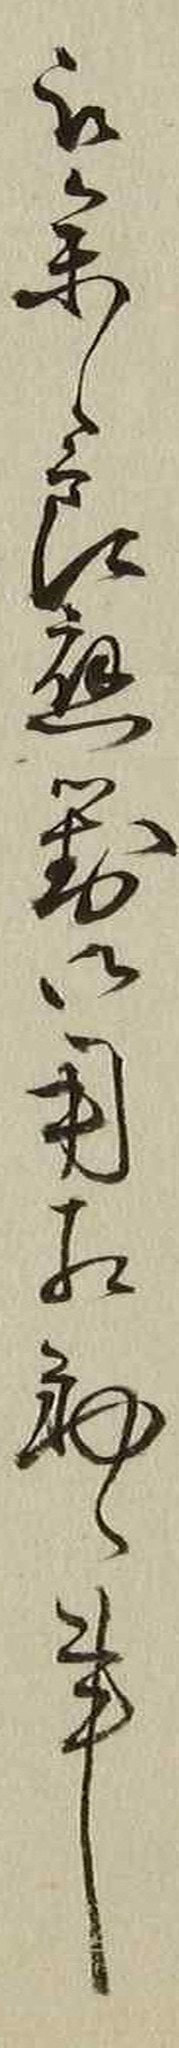被参候節応対御用相勤候事
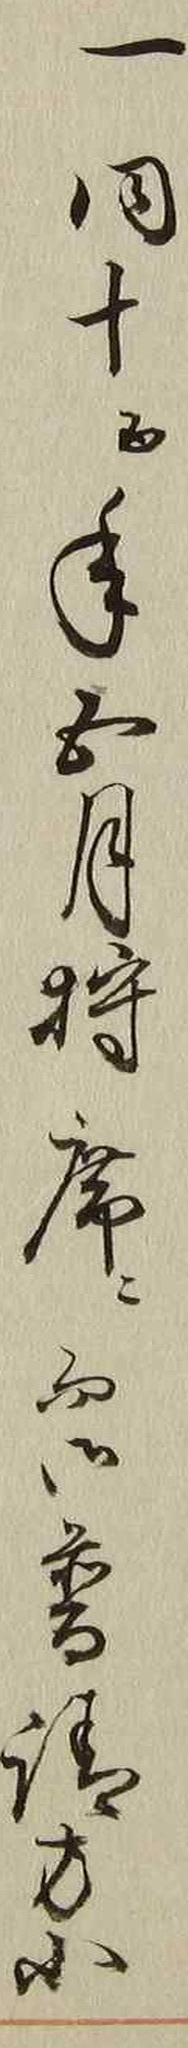一同十酉年五月狩席ニ而御普請方小
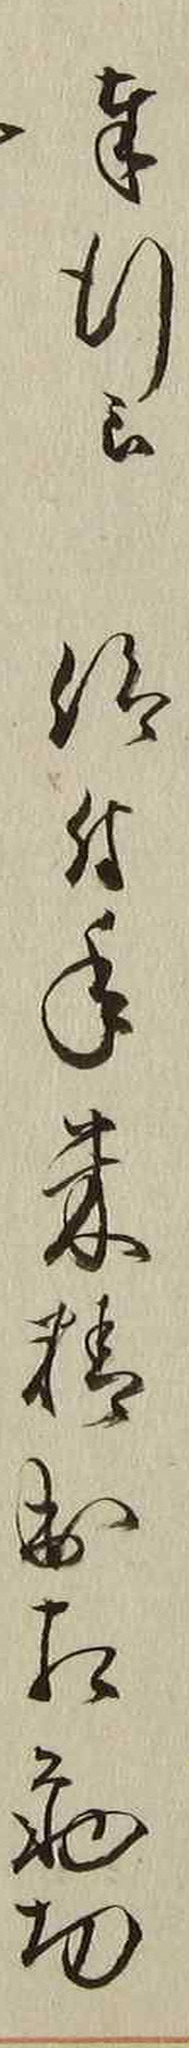奉行被仰付年米精出相勤功
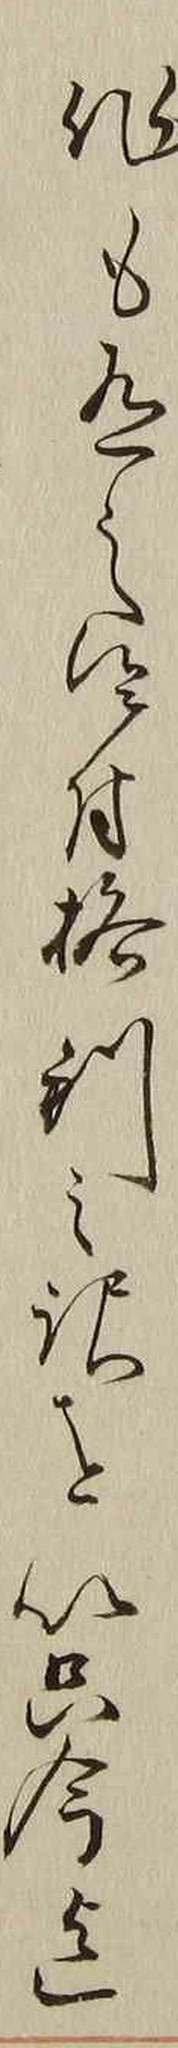作も有之候ニ付格別之訳を以只今迄
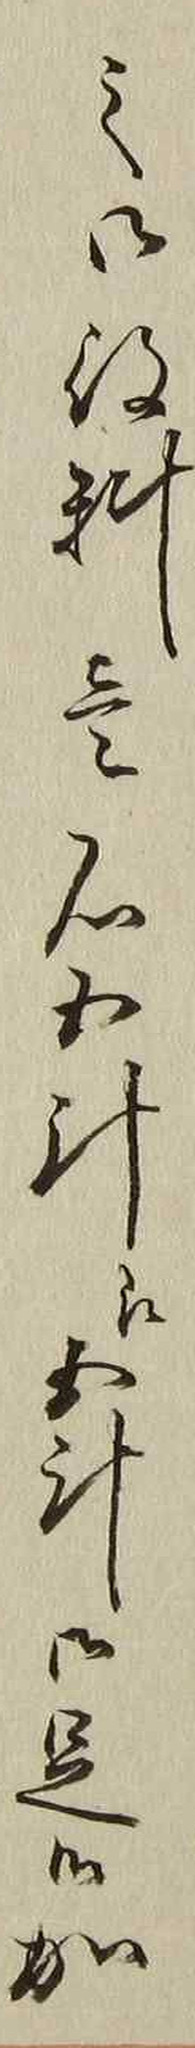之御役料壱石五斗江五斗御足御加
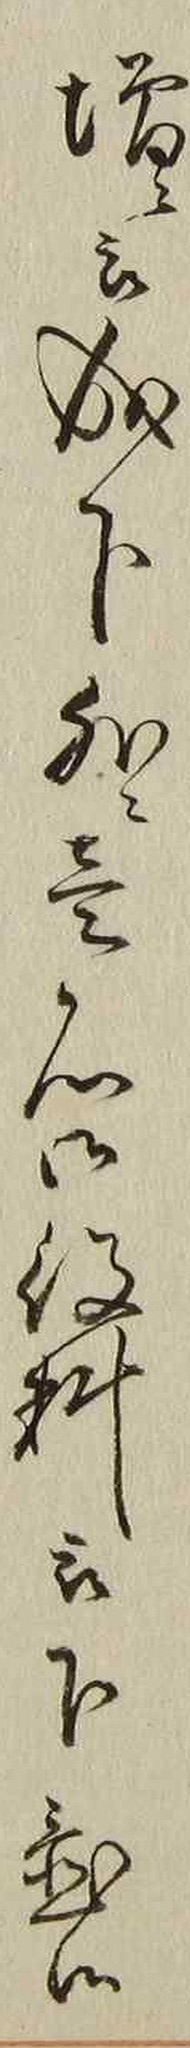増ニ被成下外ニ壱石御役料被下置候
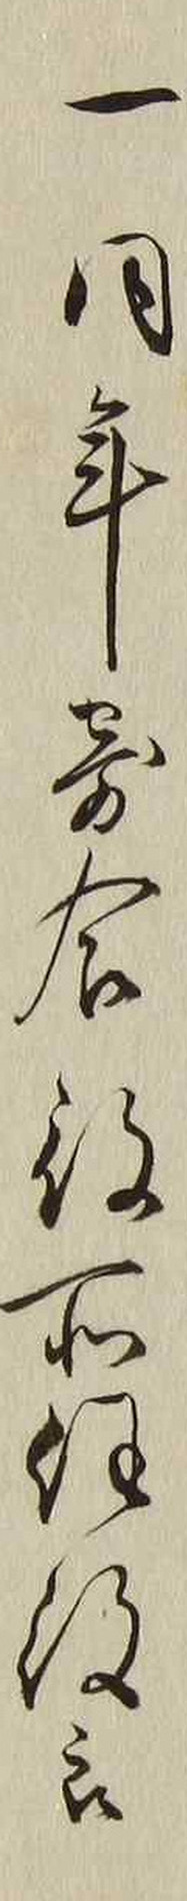一同年寄合役所任役被
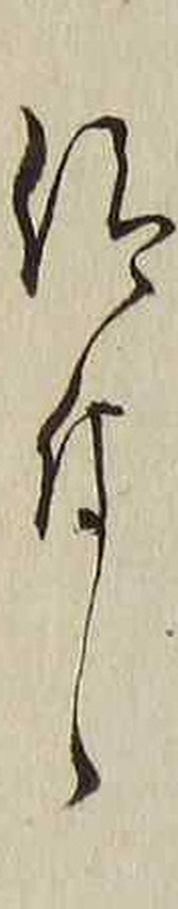仰付候
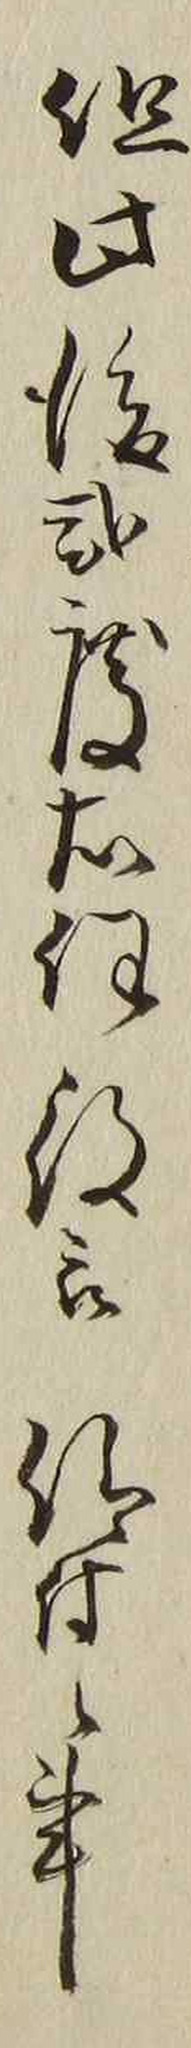但此後弐度右任役被仰付候事

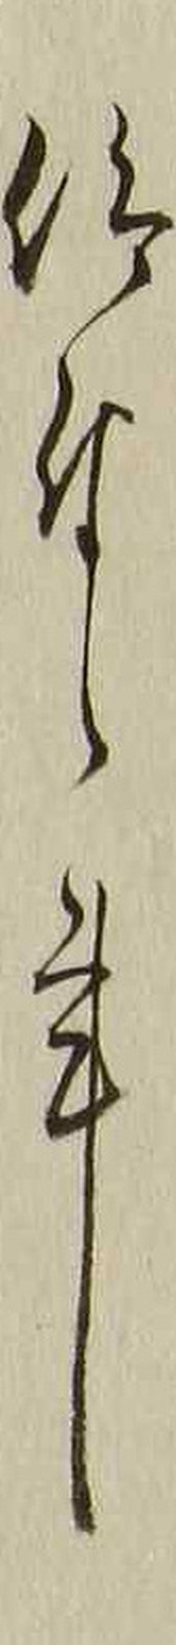仰付候事
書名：諸士系譜　巻之57　ほ之部4
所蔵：会津若松市立会津図書館
